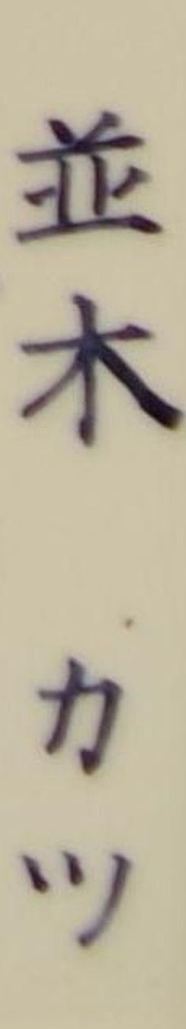並木カツ
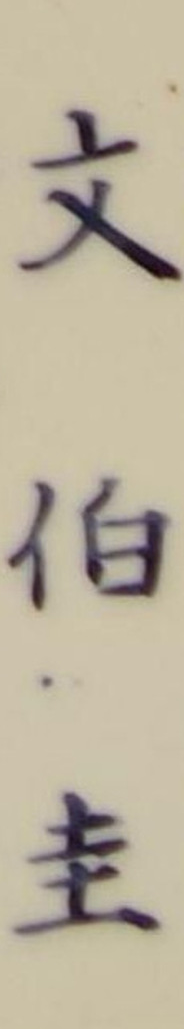文伯圭
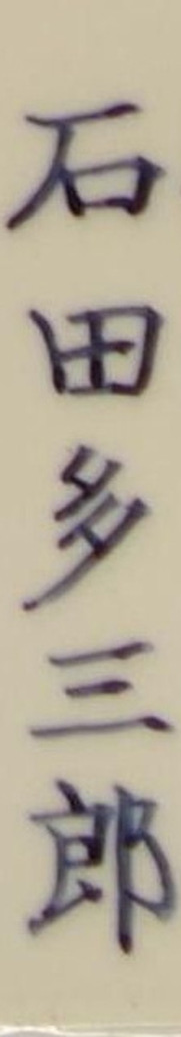石田多三郎
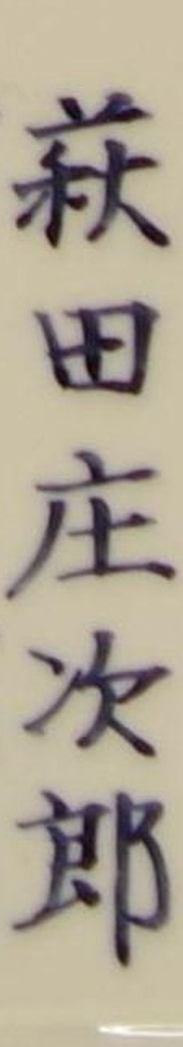萩田庄次郎
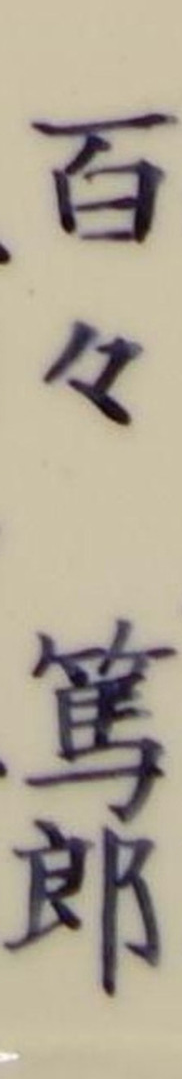百々篤郎
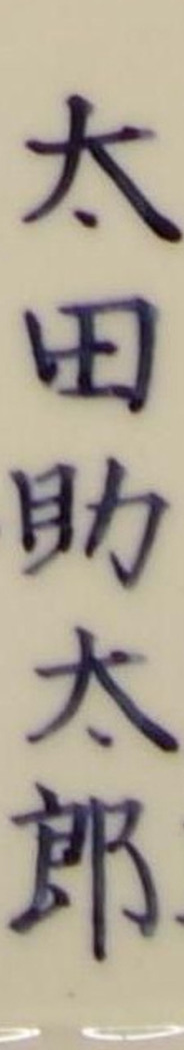太田助太郎
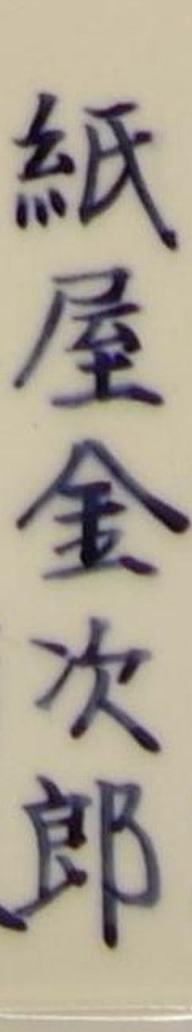紙屋金次郎
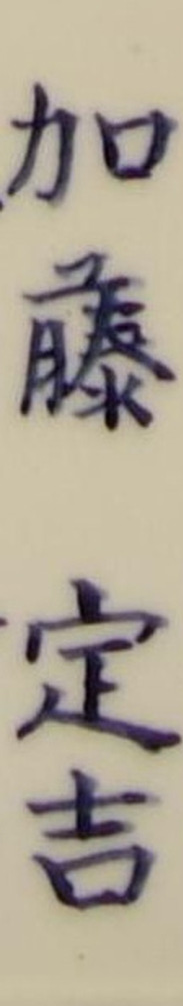加藤定吉
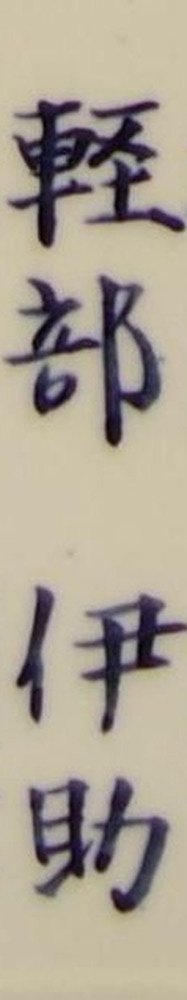軽部伊助
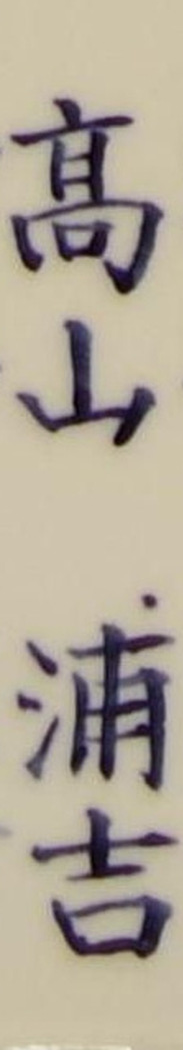高山浦吉
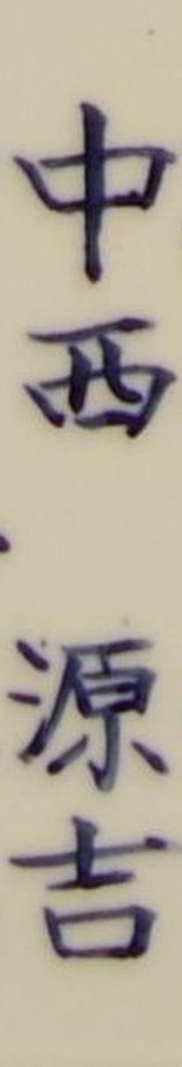中西源吉
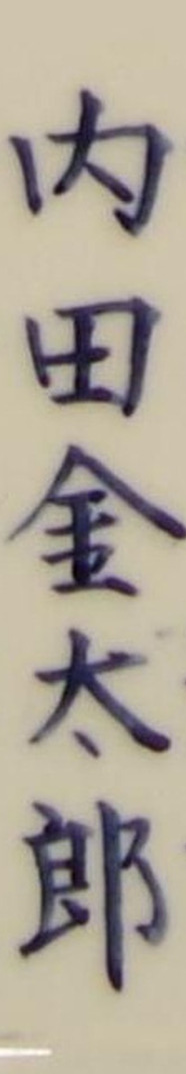内田金太郎
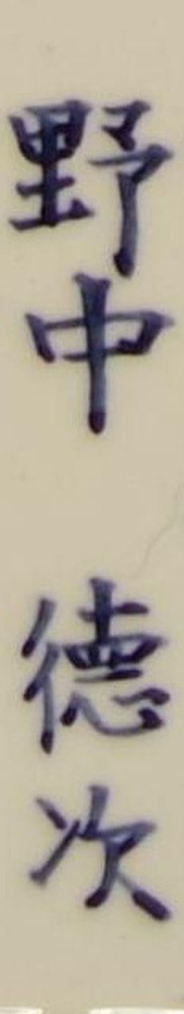野中徳次
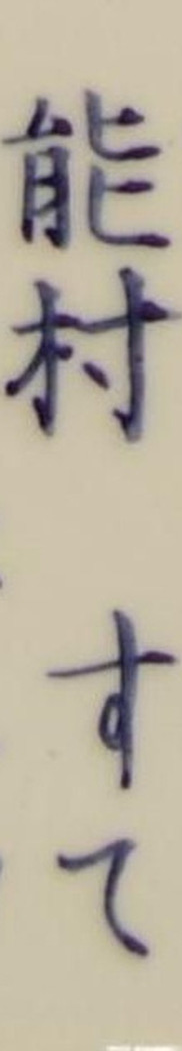能村すて
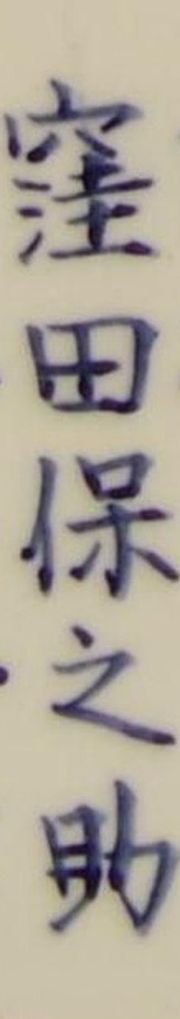窪田保之助
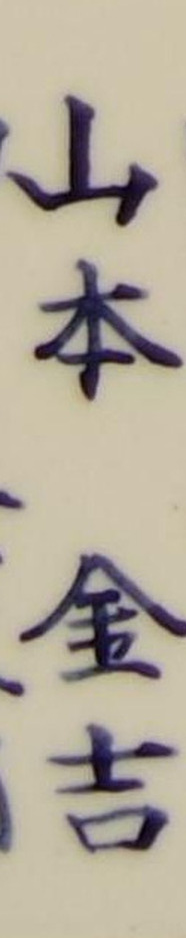山本金吉
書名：A~D
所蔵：koyasan kongobuji
